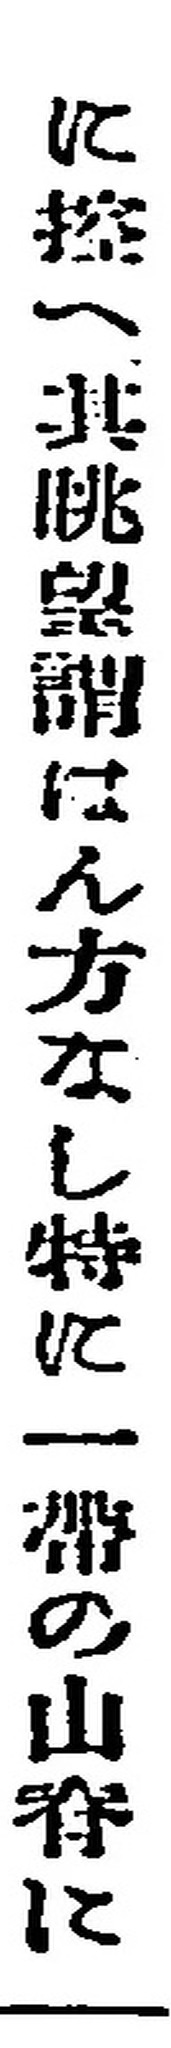に控へ其眺望謂はん方なし特に一体の山脊に
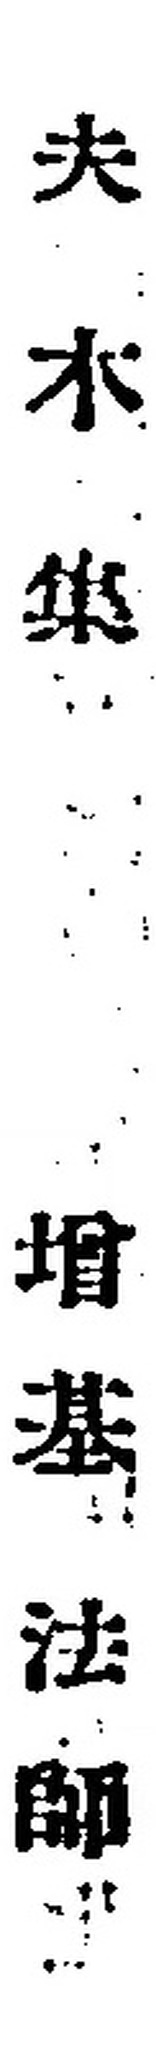夫木集増基法師
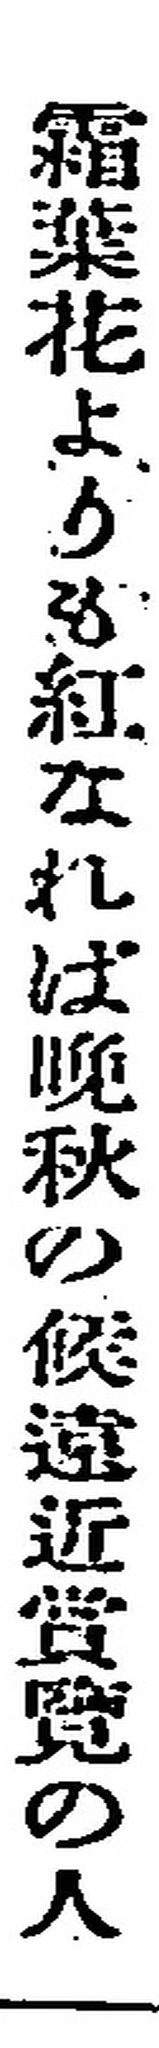霜葉花よりも紅なれば晩秋の候遠近賞覧の人
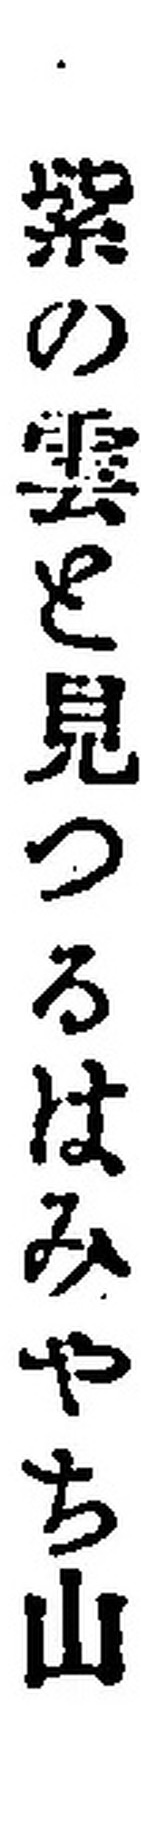紫の雲と見つるはみやち山
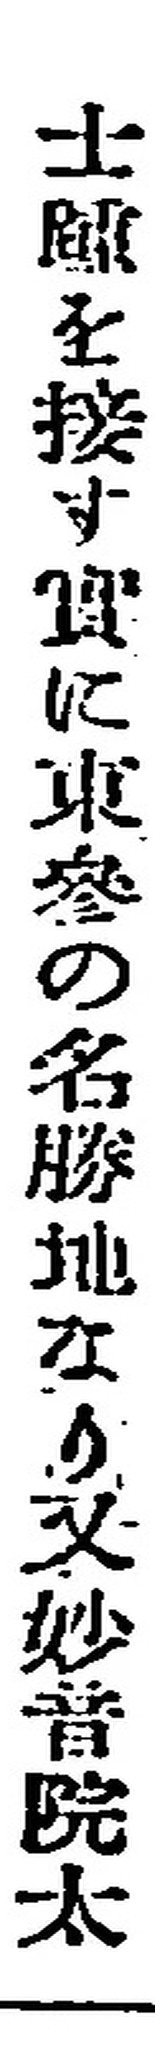士踵を接す実に東参の名勝地なり又妙音院太
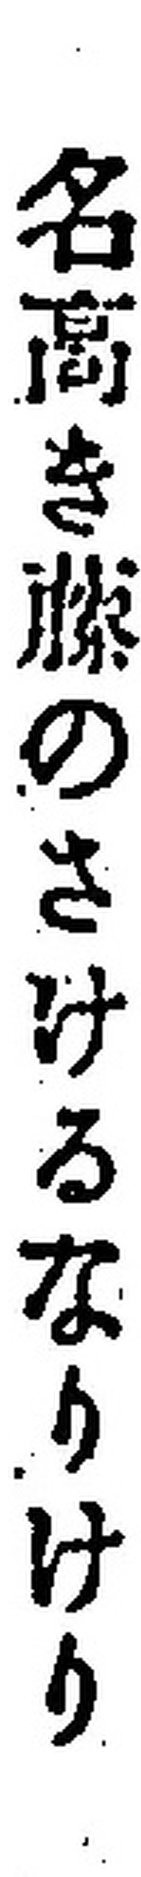名高き藤のさけるなりけり
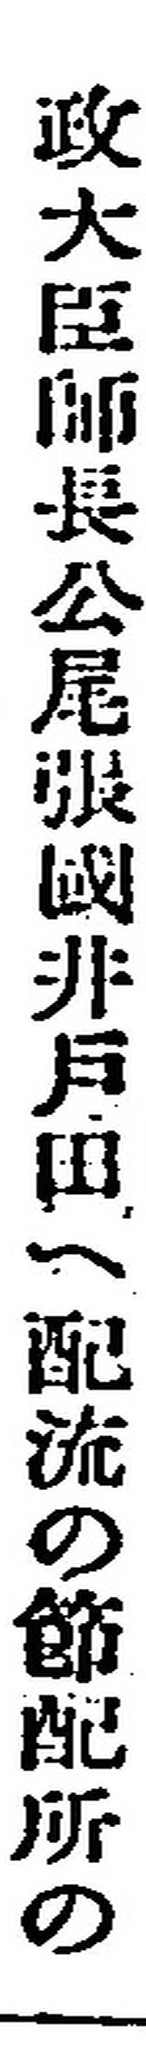政大臣師長公尾張国井戸田へ配流の節配所の
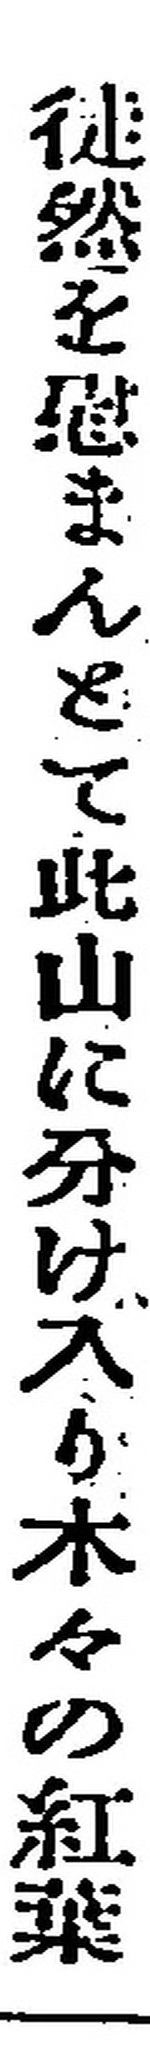徒然を慰まんとて此山に分け入り木々の紅葉
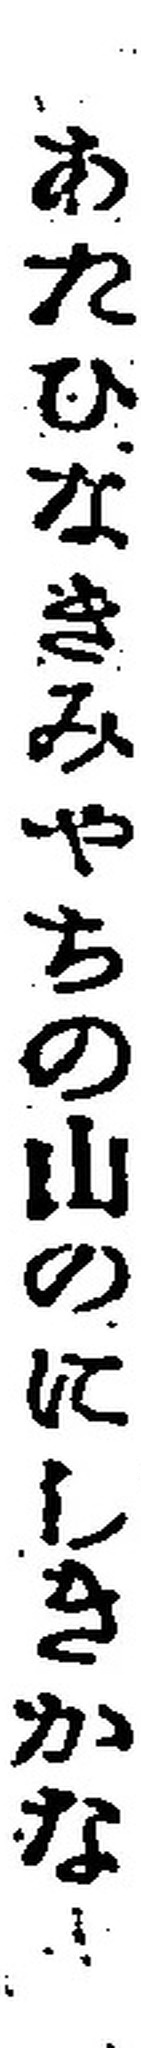あたひなきみやち山のにしきかな
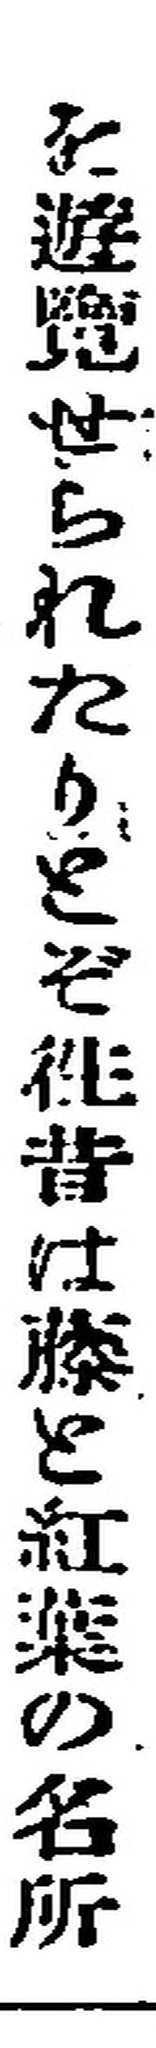を遊覧せられたりとぞ往昔は藤と紅葉の名所
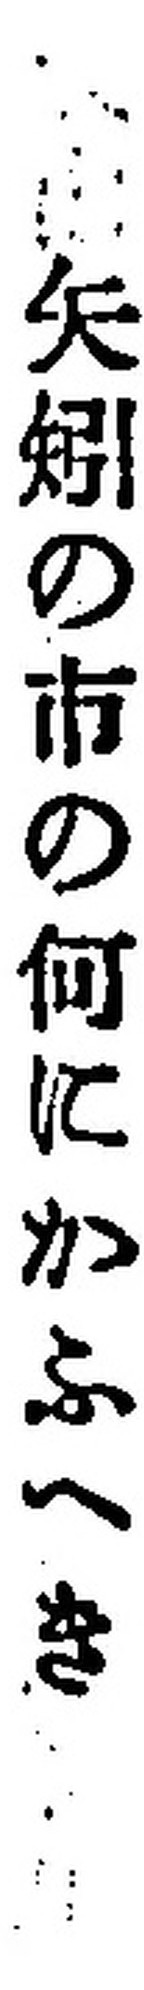矢矧の市の何にかふへき
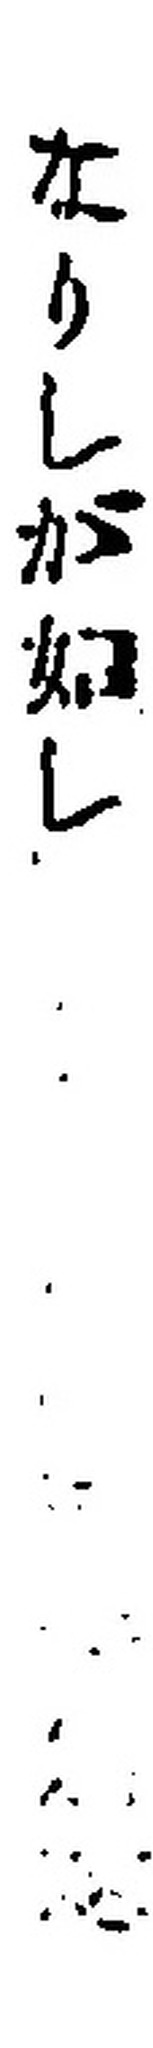なりしが如し
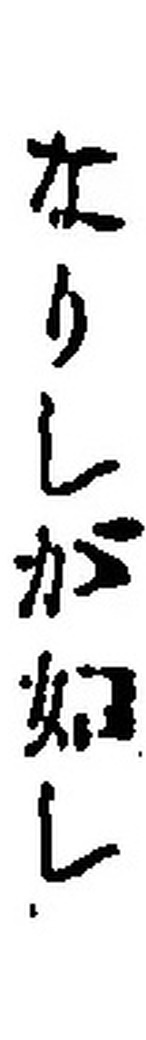なりしが如し
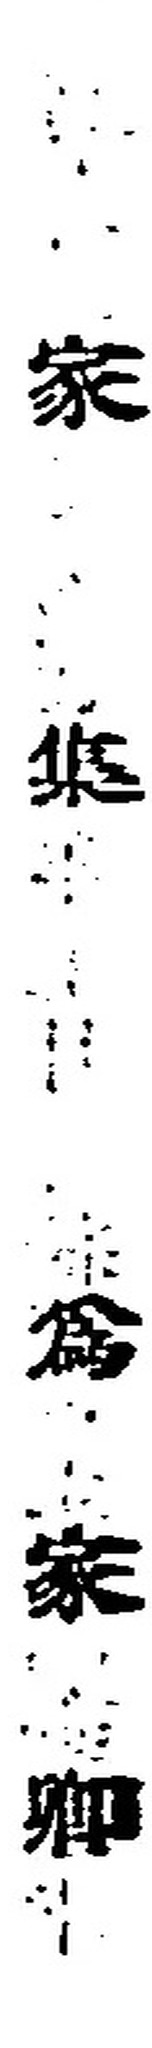家集為家卿
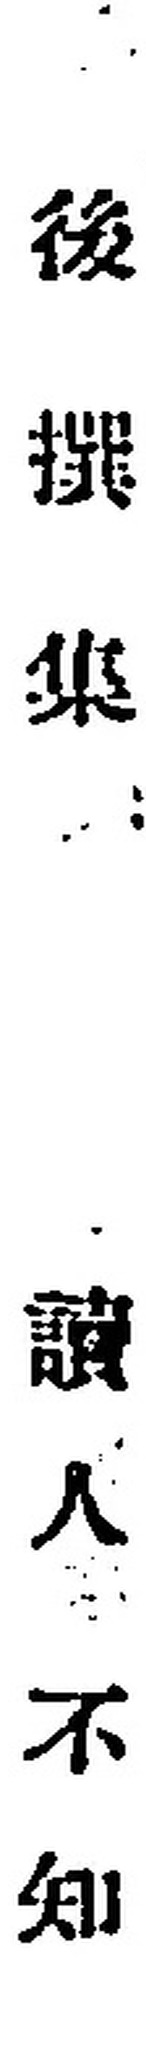後撰集読人不知
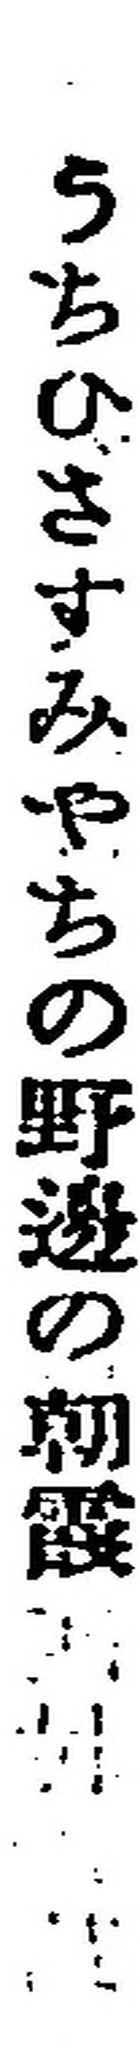うちひさすみやちの野辺の朝霞
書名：東参名勝案内
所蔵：国立国会図書館 National Diet Library, JAPAN
